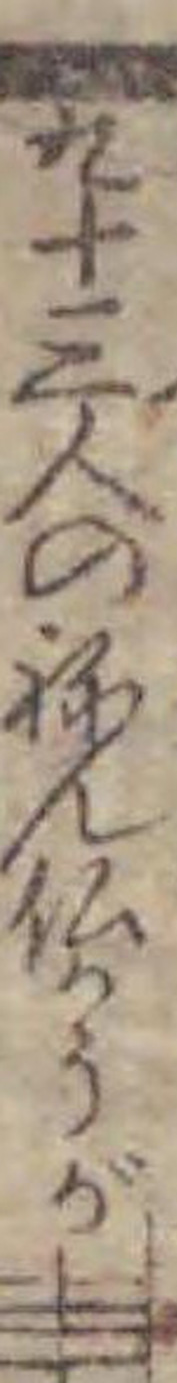九十三人のねん仏かうが
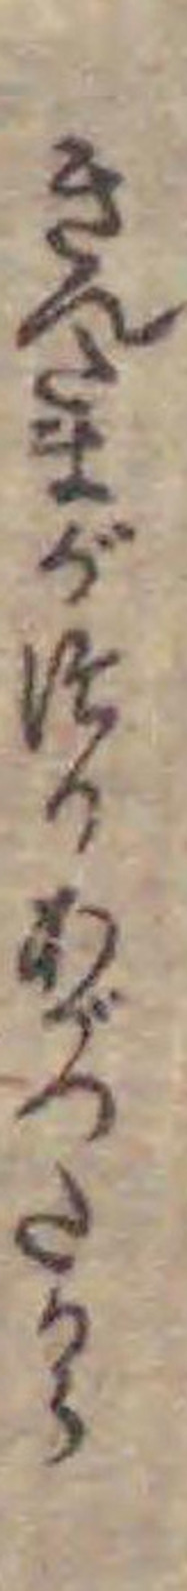きんたまがつりあがつたから
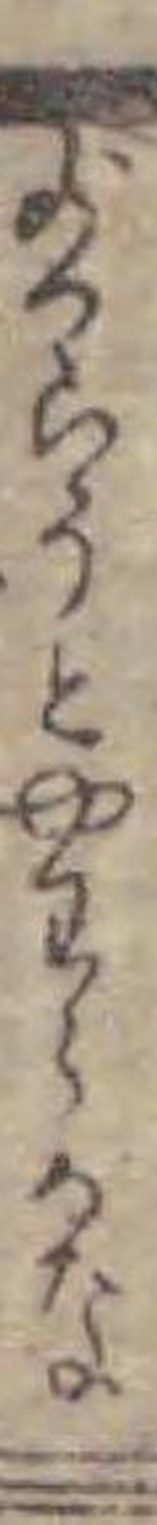よからうとやわらかな
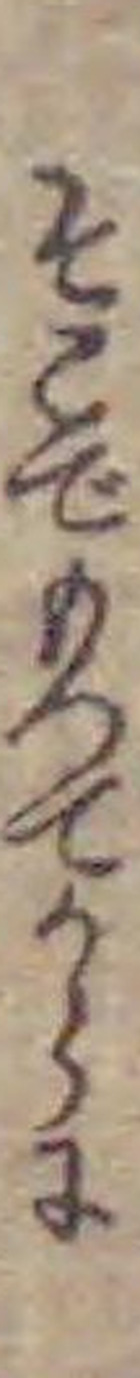そこでもつてからに
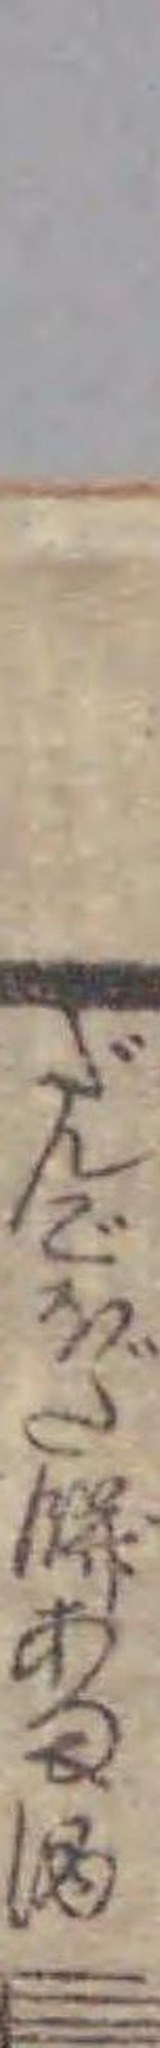だんごぼた餅あま酒
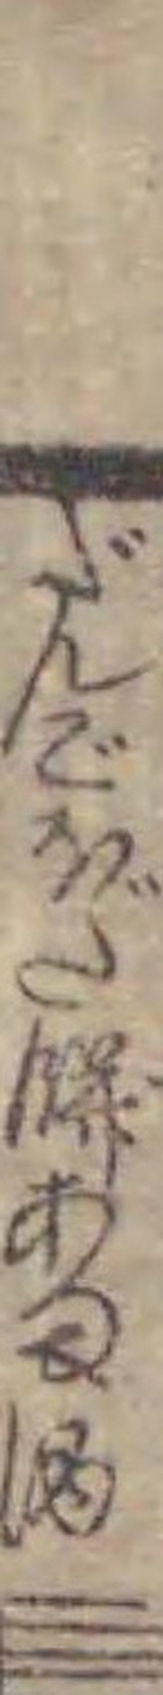だんごぼた餅あま酒
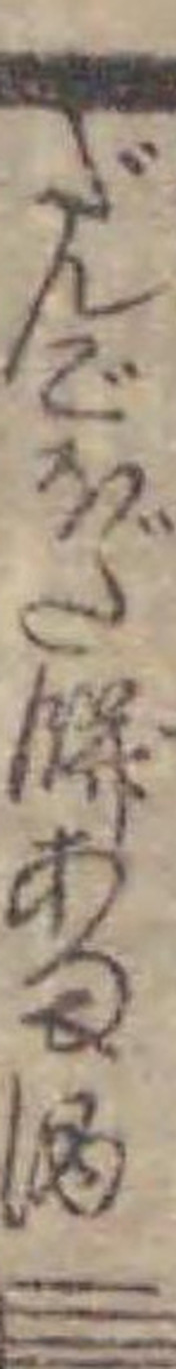だんごぼた餅あま酒
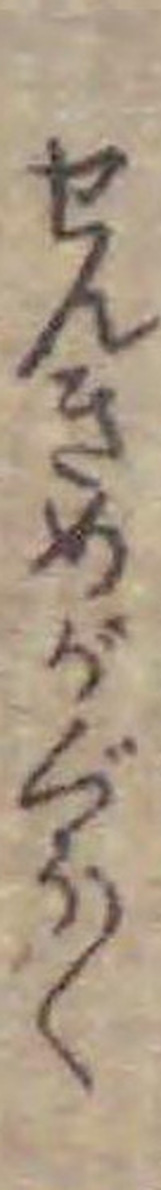せんきめがぐう〳〵
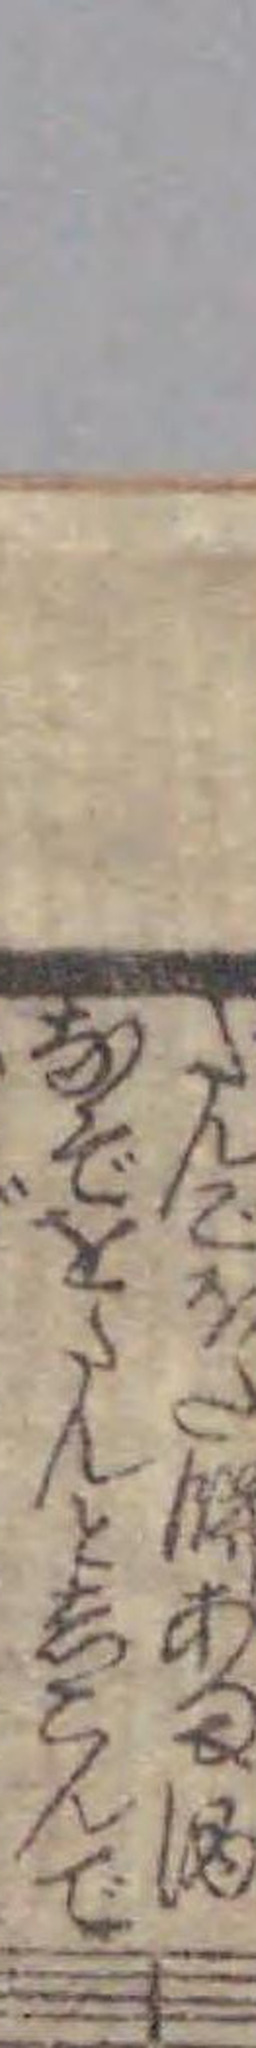なぞをたんとしこんで
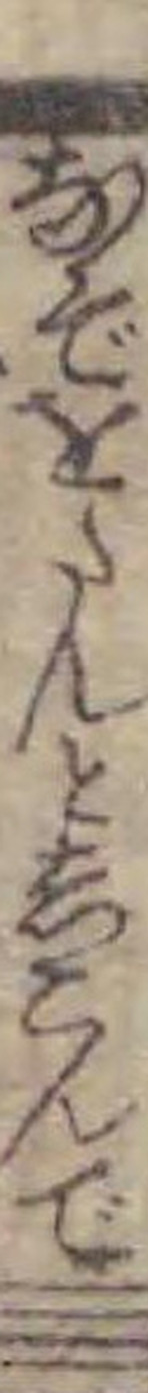なぞをたんとしこんで
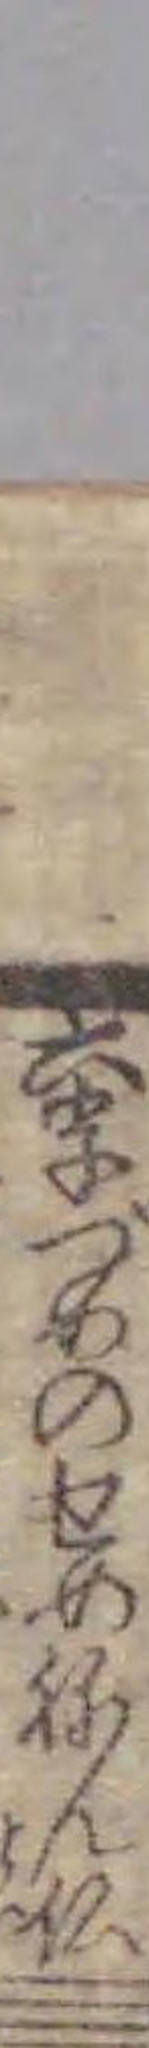六字づめのせめねん仏
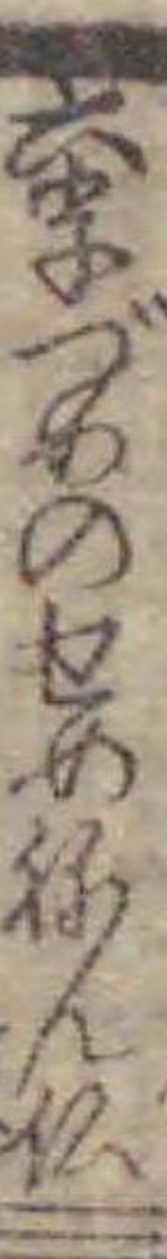六字づめのせめねん仏
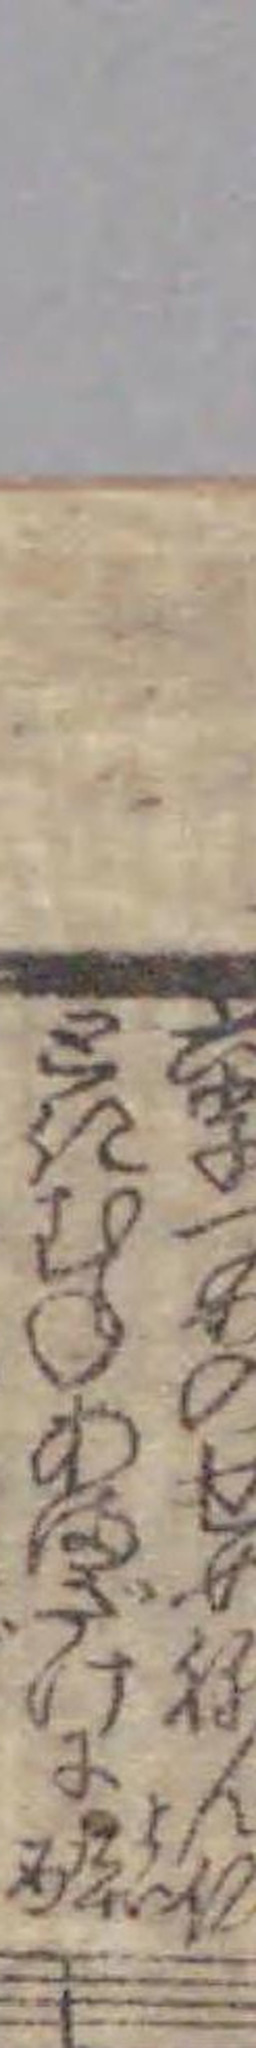ときむねあまざけに酔
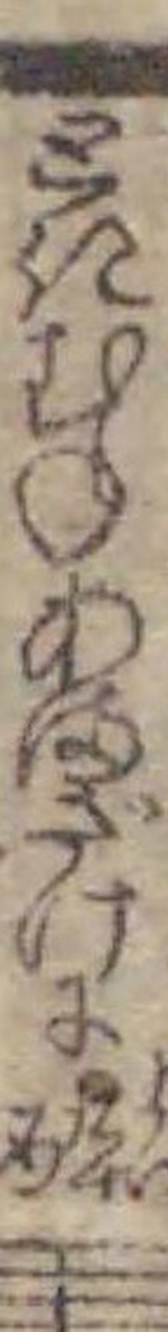ときむねあまざけに酔
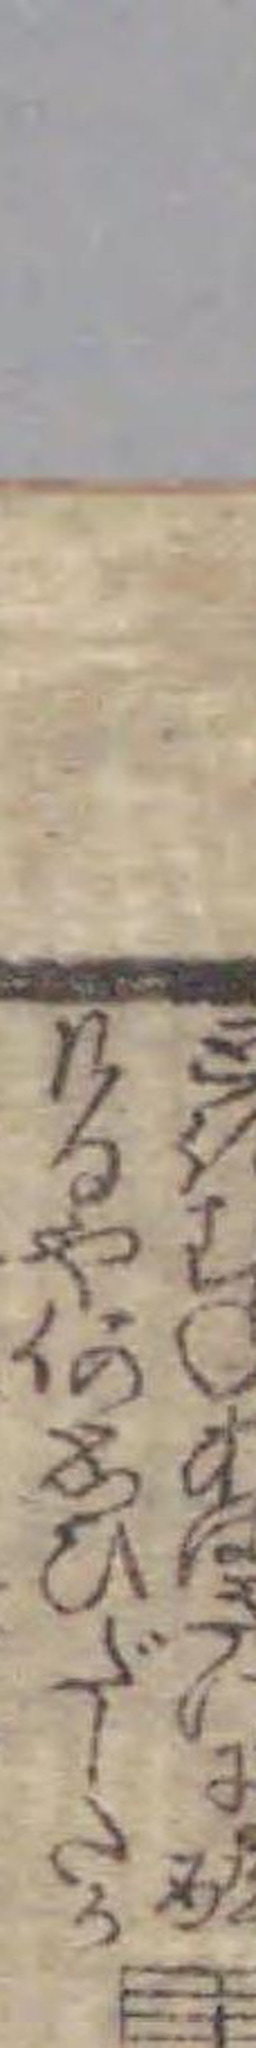けるや何思ひだしたか
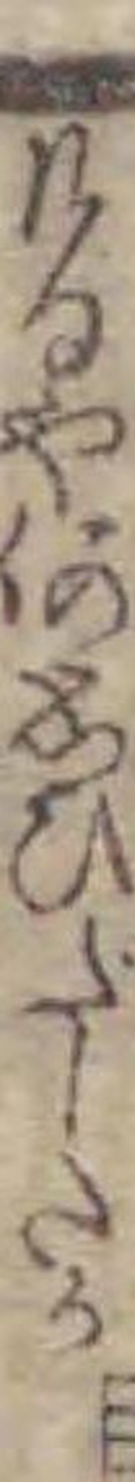けるや何思ひだしたか
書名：年寄之冷水曽我 : 3巻
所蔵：国立国会図書館 National Diet Library, JAPAN
